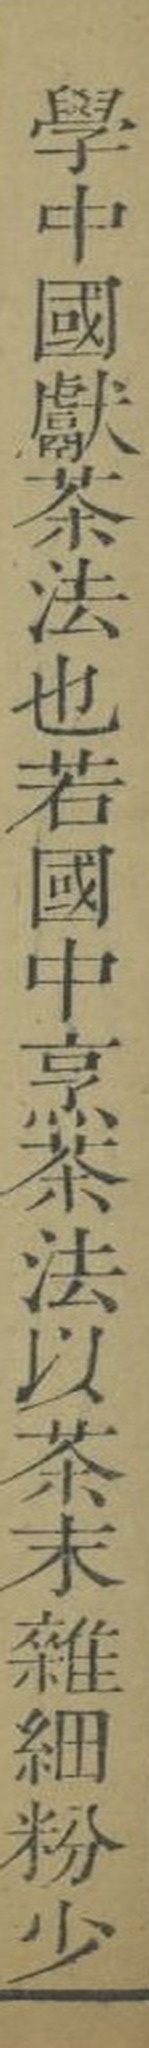学中国献茶法也若国中烹茶法以茶末雑細粉少
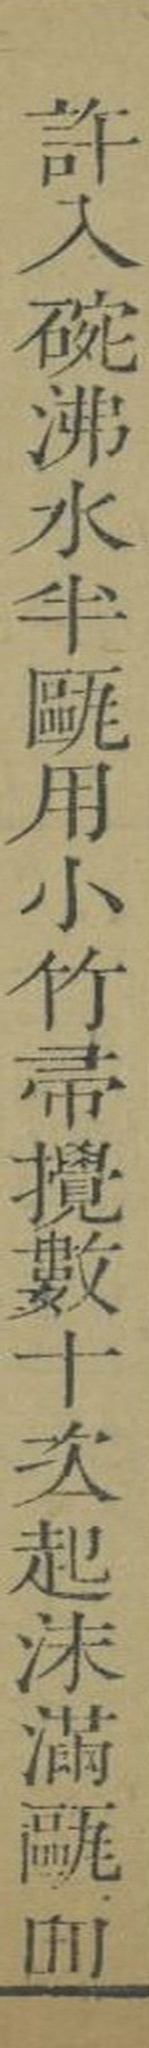許入碗沸水半甌用小竹帚攪数十次起沫満甌面
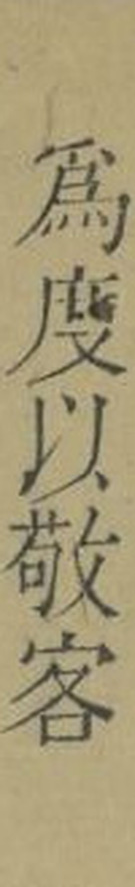為度以敬客

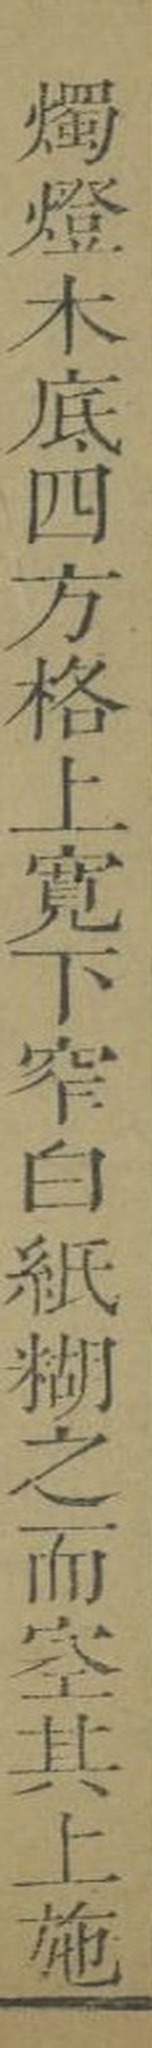燭灯木底四方格上寛下窄白紙糊之而空其上施
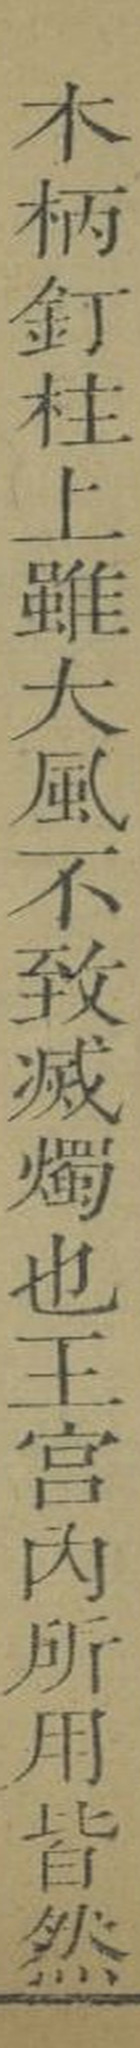木柄釘柱上雖大風不致滅燭也王宮内所用皆然
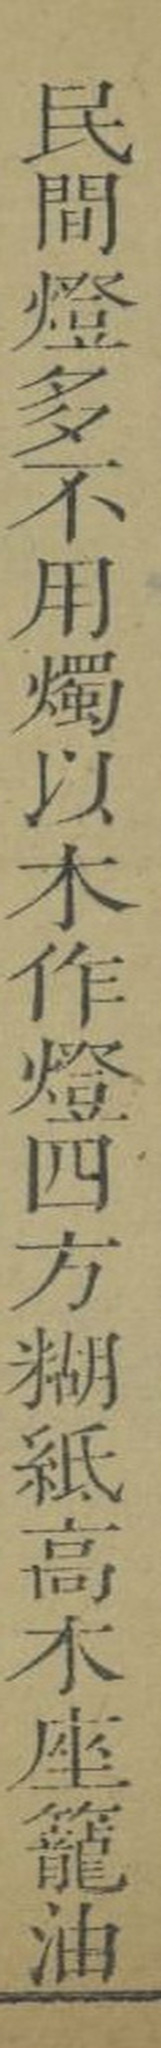民間灯多不用燭以木作灯四方糊紙高木座篭油
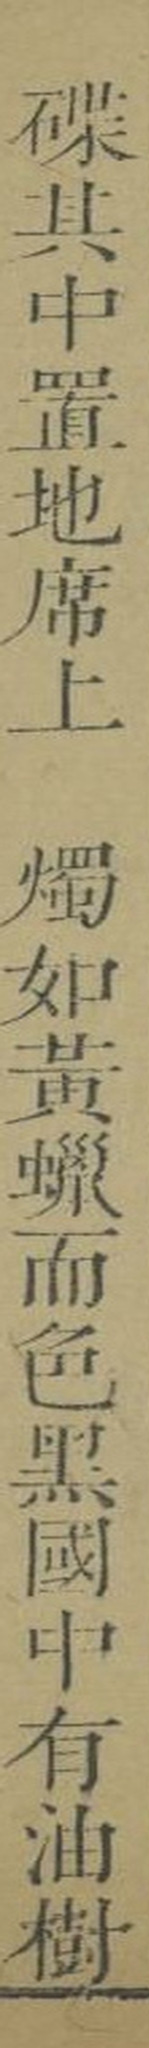碟其中置地席上燭如黄蝋而色黒国中有油樹
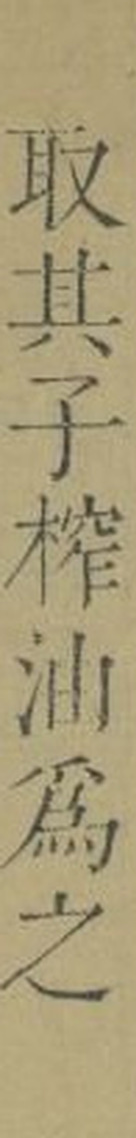取其子榨油為之
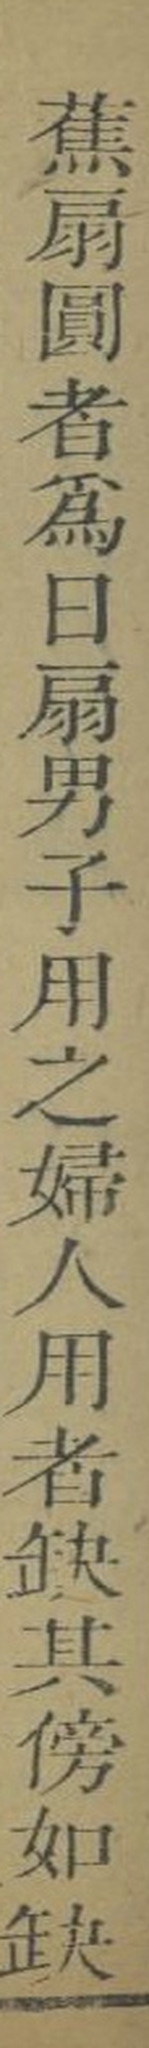蕉扇円者為日扇男子用之婦人用者欠其傍如欠
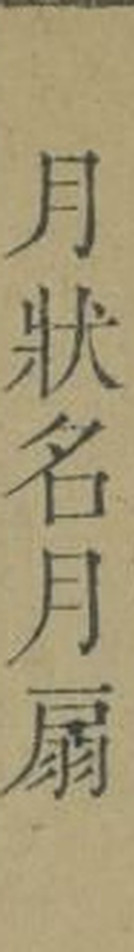月状名月扇
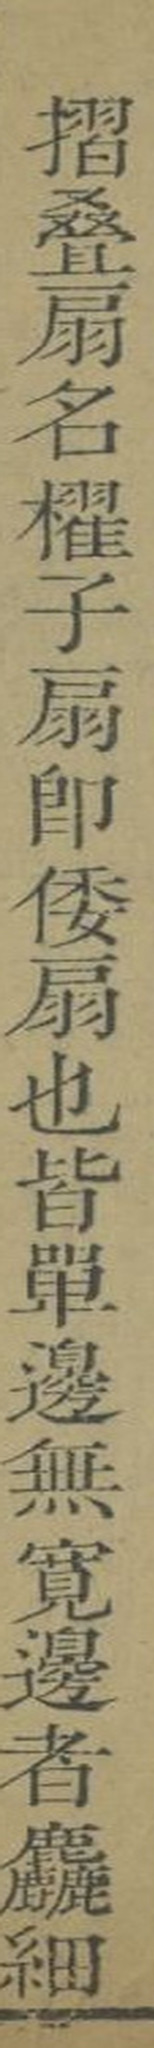摺畳扇名櫂子扇即倭扇也皆単辺無寛辺者麤細
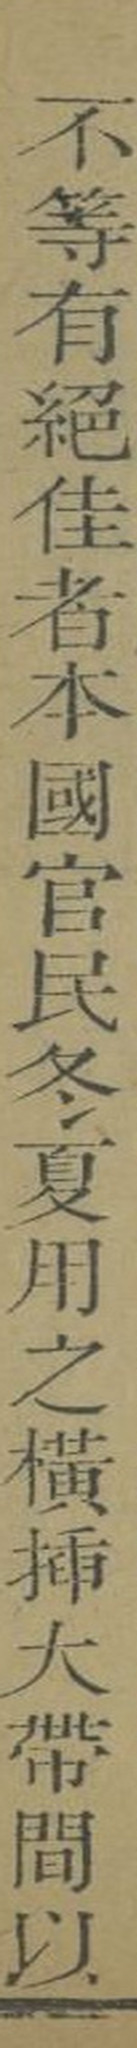不等有絶佳者本国官民冬夏用之横揷大帯間以
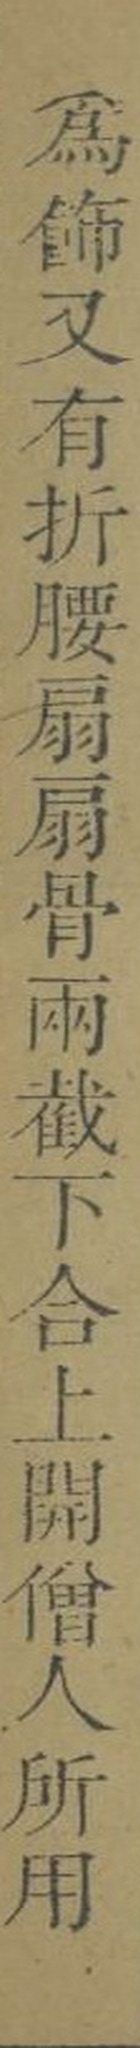為飾又有折腰扇扇骨両截下合上開僧人所用

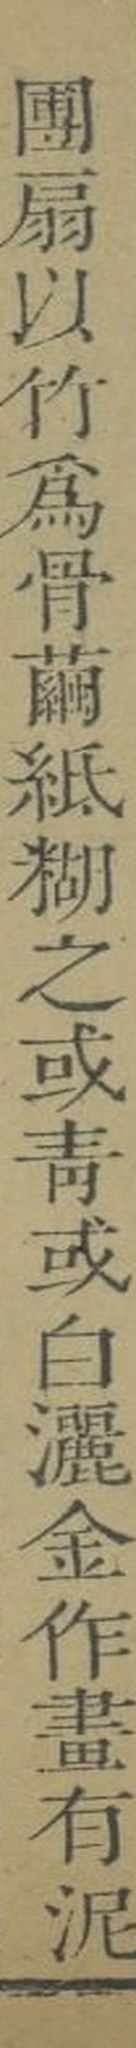団扇以竹為骨繭紙糊之或青或白灑金作画有泥
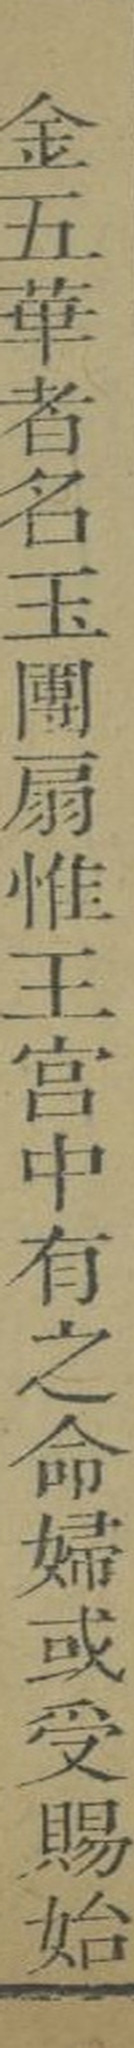金五華者名玉団扇惟王宮中有之命婦或受賜始
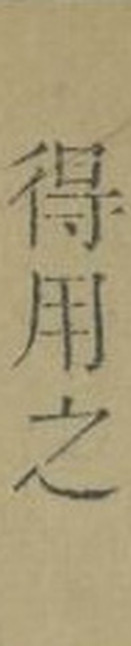得用之
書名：中山伝信録 巻六
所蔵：University of the Ryukyus Library
